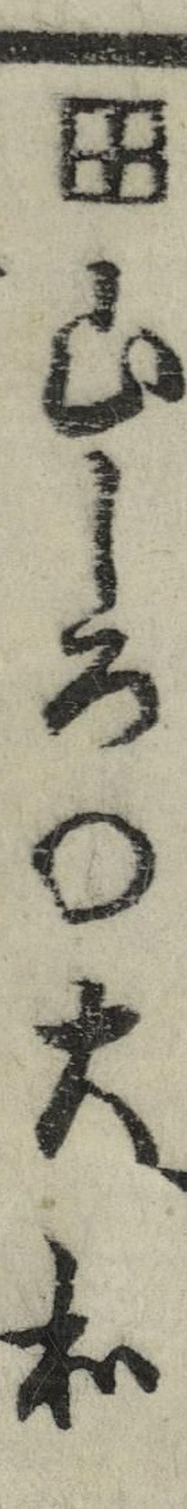田山しろ〇大和
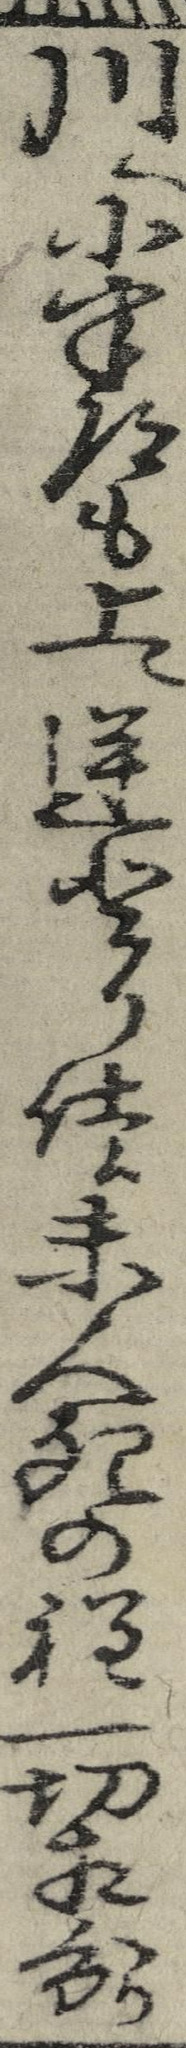川へ小半道も上ニ逆登り仕候未人死の程一切相分り
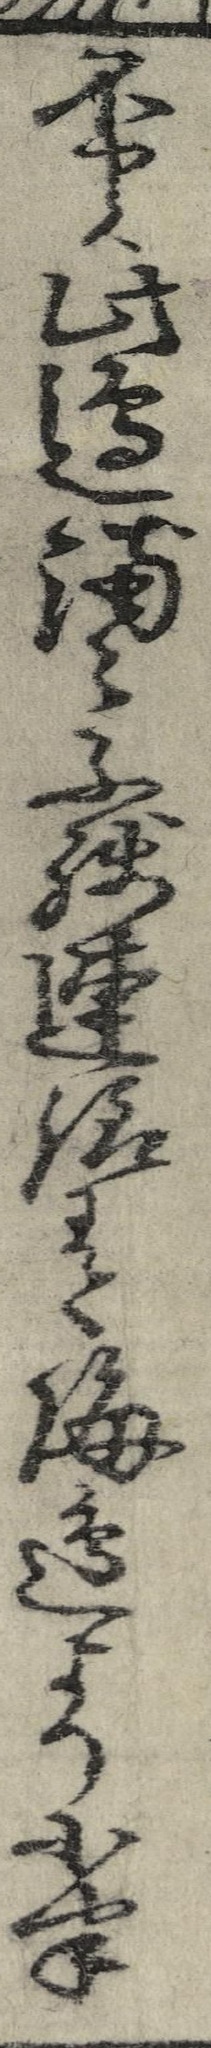不申候此辺浦々不残連浪にて海辺より小半
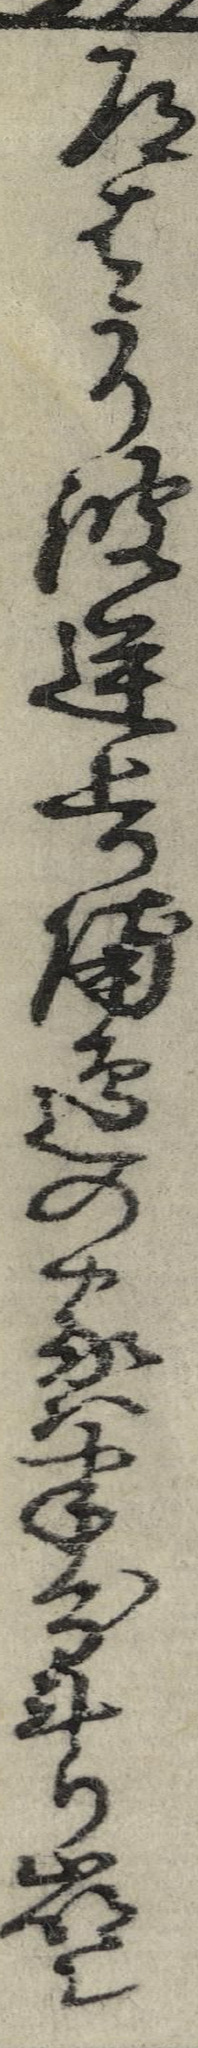路はかり波逆上り浦辺の家ハ半分斗り崩レ
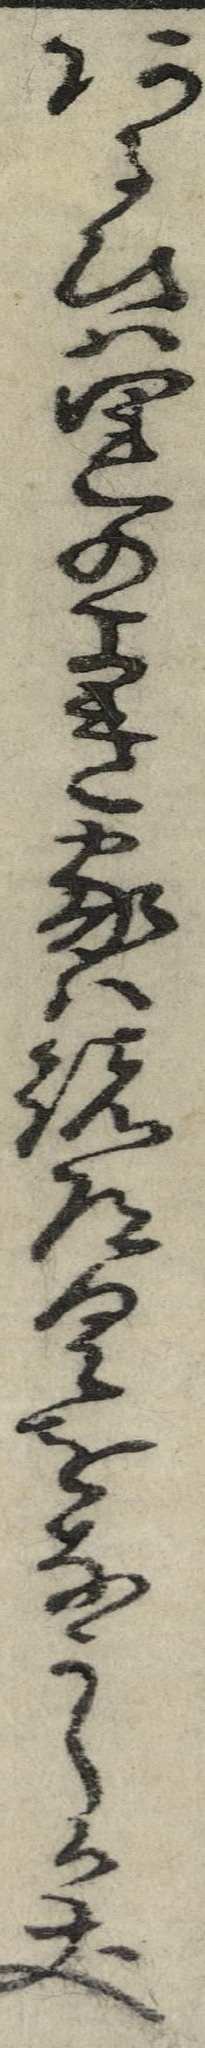あるひハ運のよき家ハ諸道具をなかし候丈
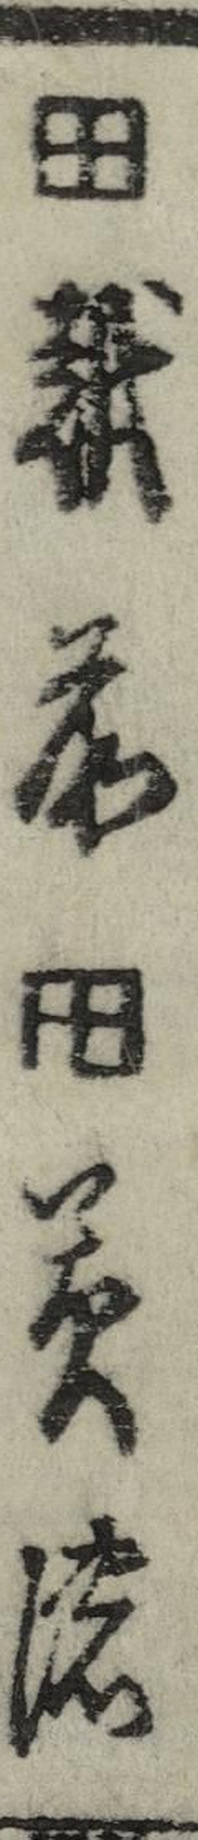田越前田美濃
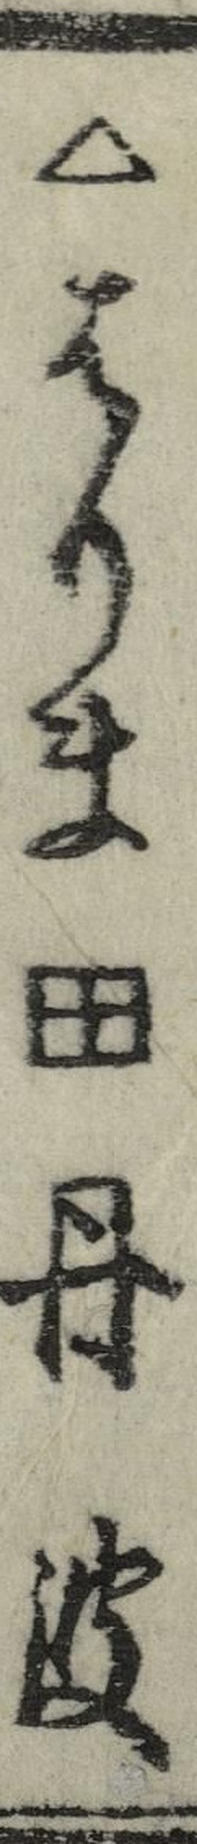△はりま田丹波
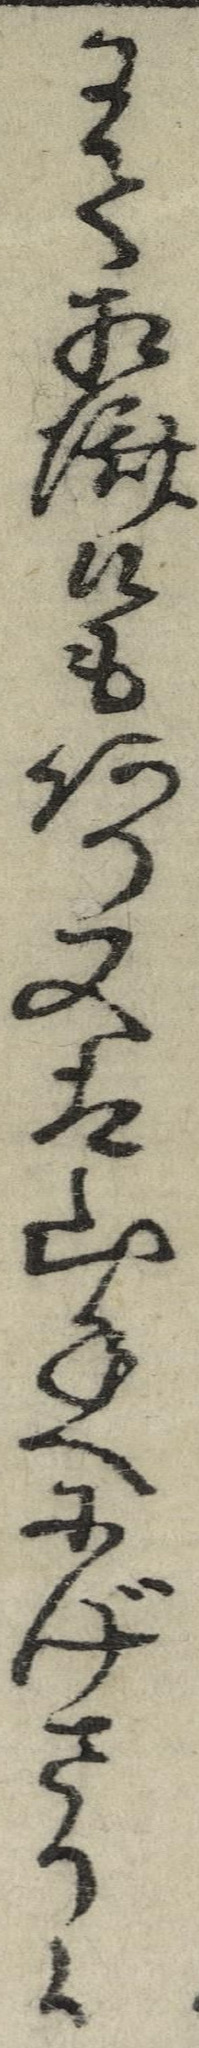にて相済候もあり又は山手へにげさり候
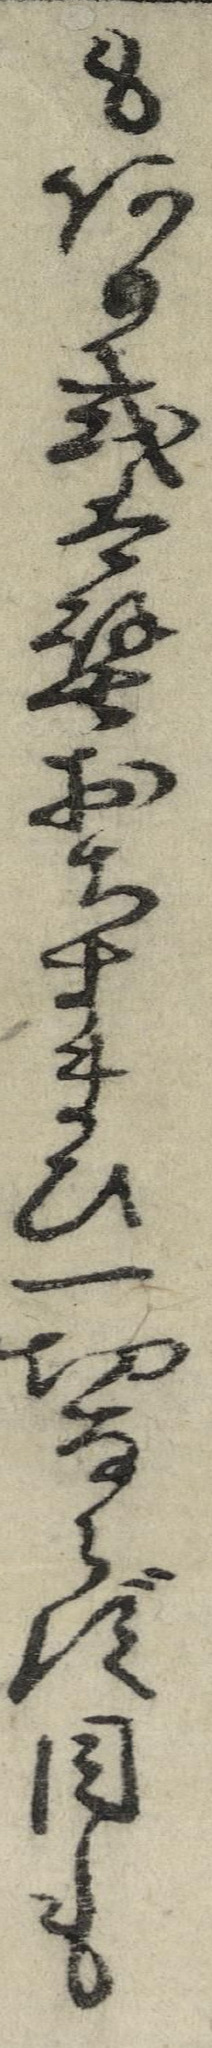もあり或は譬おちすまひ一切ならず目も
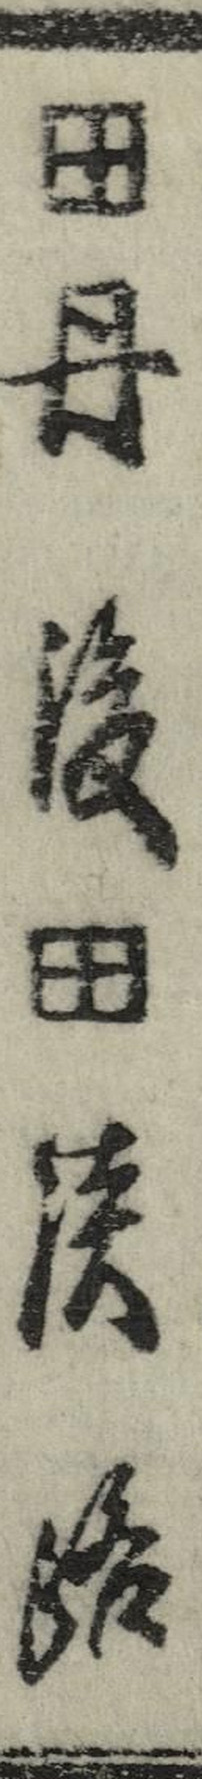田丹後田淡路
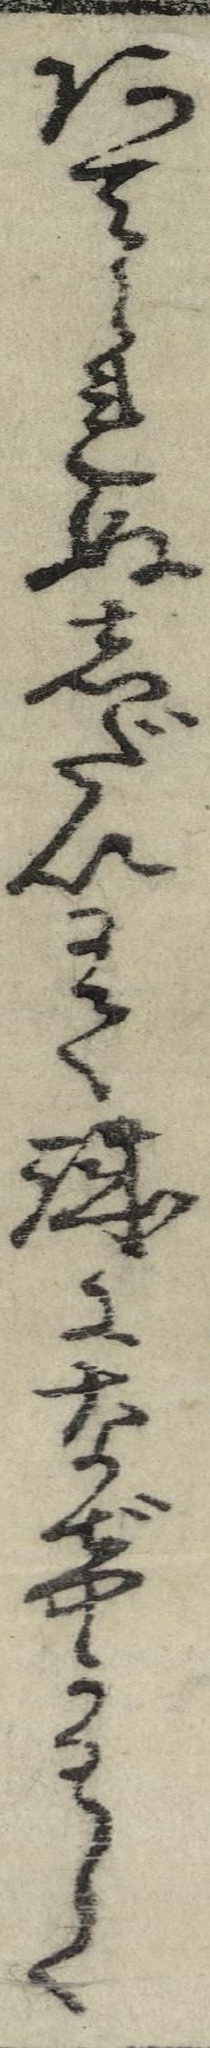あてられぬしだいにて誠ニなげかわしく
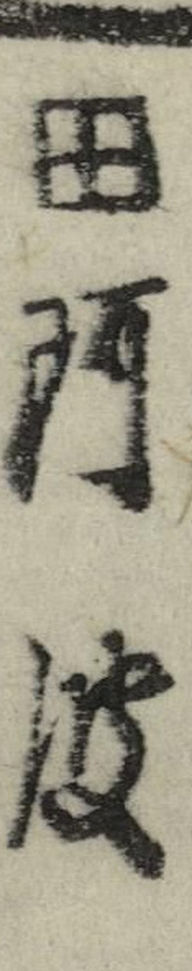田阿波
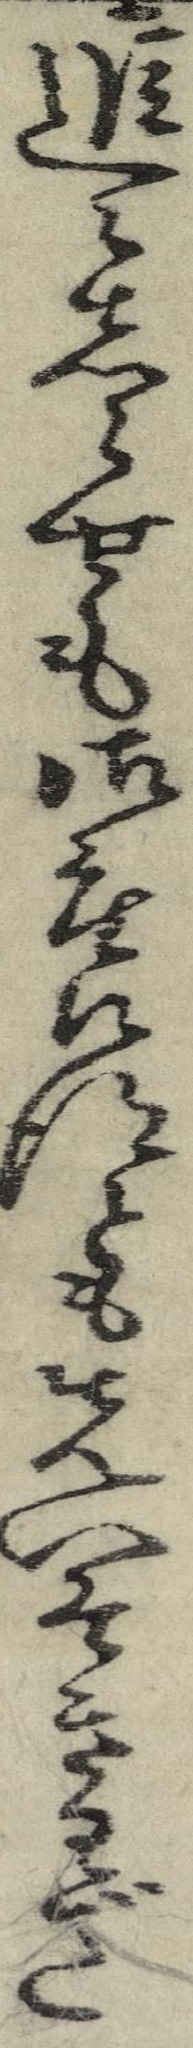追々しらせも御座候得とも先いそきわざ
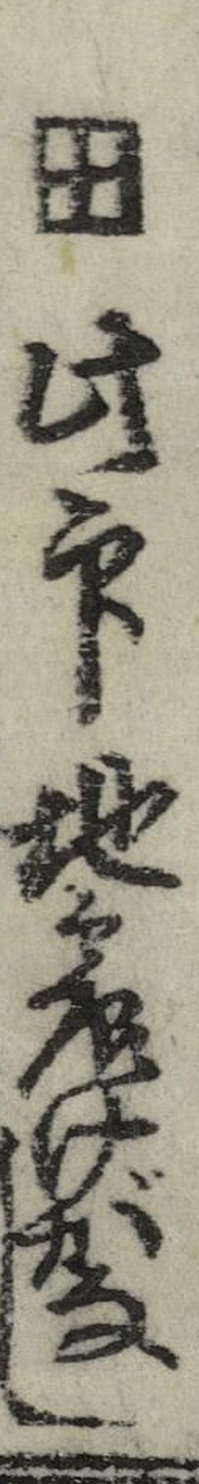田此印地震けがなし
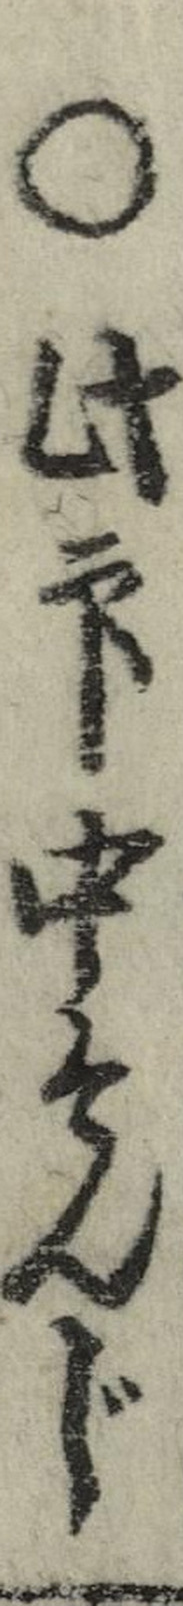〇此印中そんじ
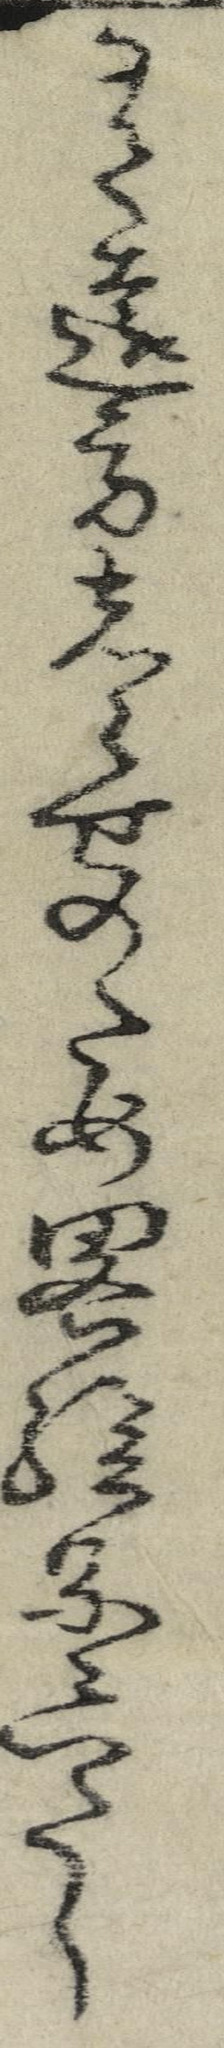にて遠方しらせのため略絵図ニいたし
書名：[安政東南海地震に関する瓦版]
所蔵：東京大学地震研究所図書室 Earthquake Research Institute Library, The University of Tokyo, JAPAN
